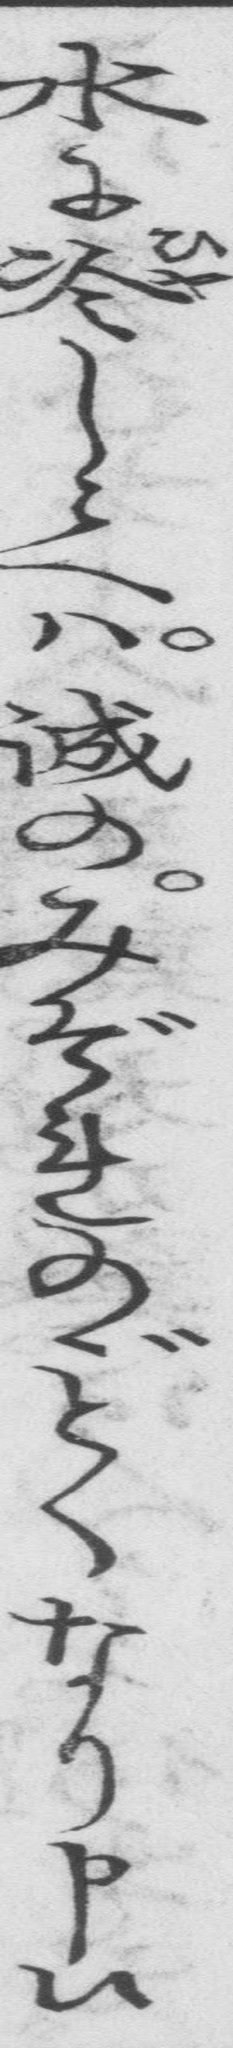水に冷し候へは。誠のみぞれのごとくなり申候
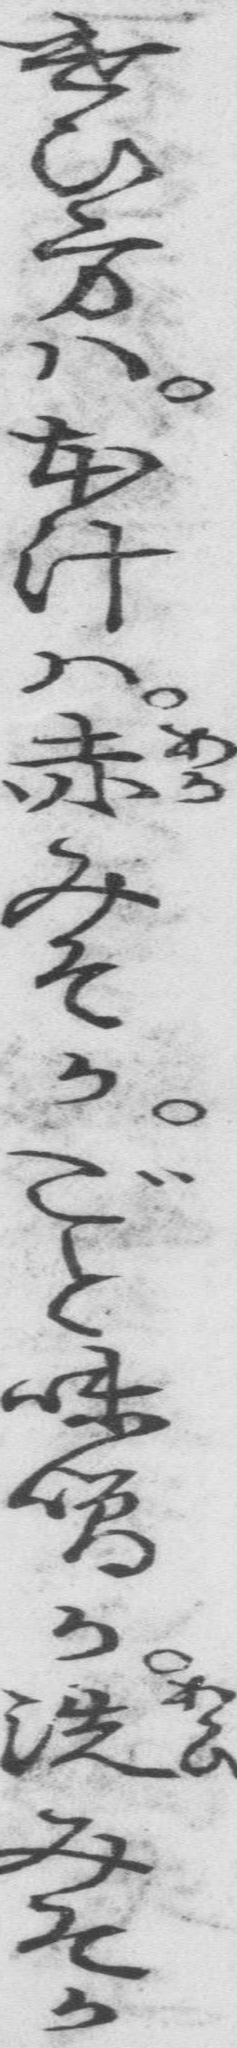遣ひ方は。本汁は。赤みそか。ごと味噌か。洗みそか
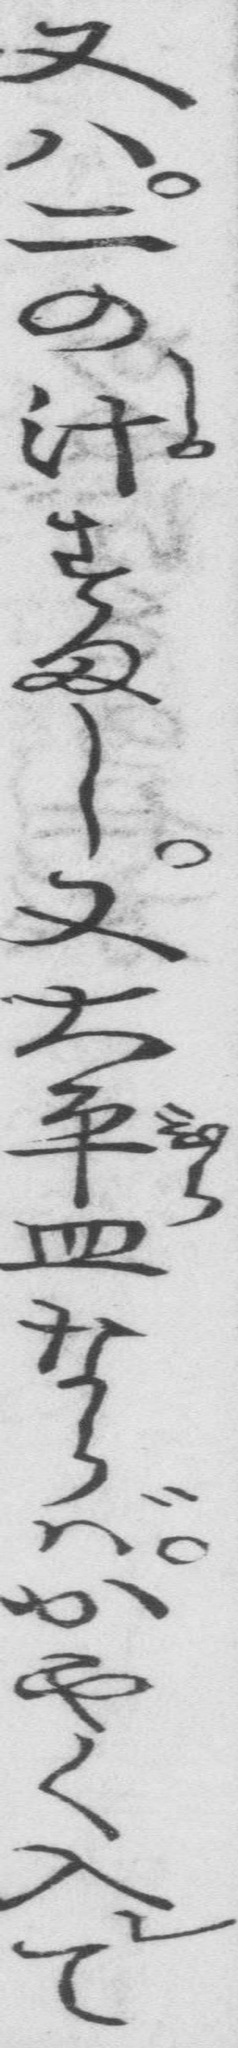又は。二の汁すまし。又大平皿ならば。かやく入れて
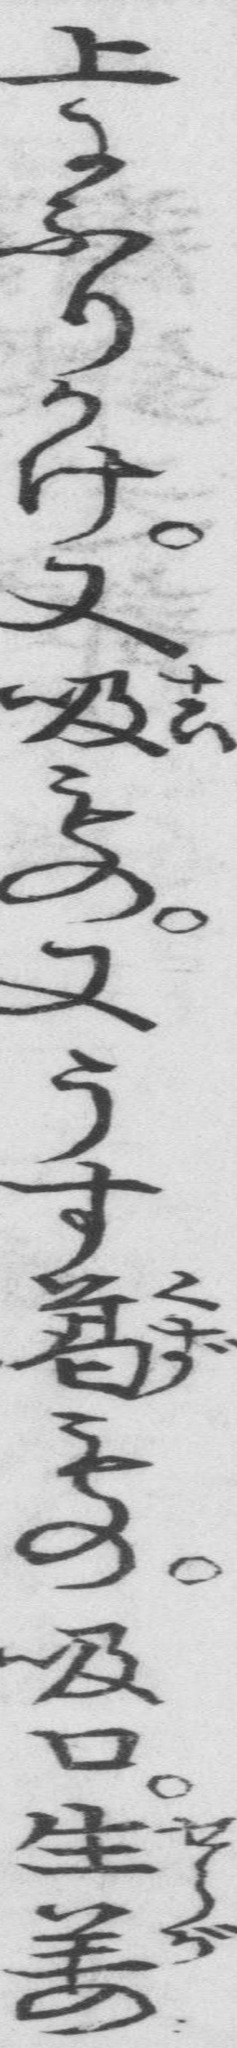上にふりかけ。又吸もの。又うす葛もの。吸口。生姜
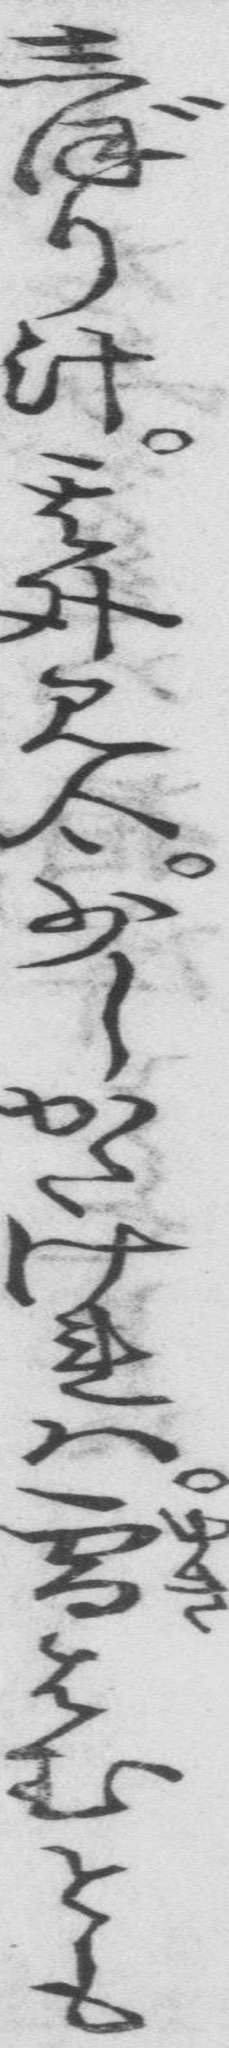しぼり汁。其外見合。少しかたけれは。雪はむとも

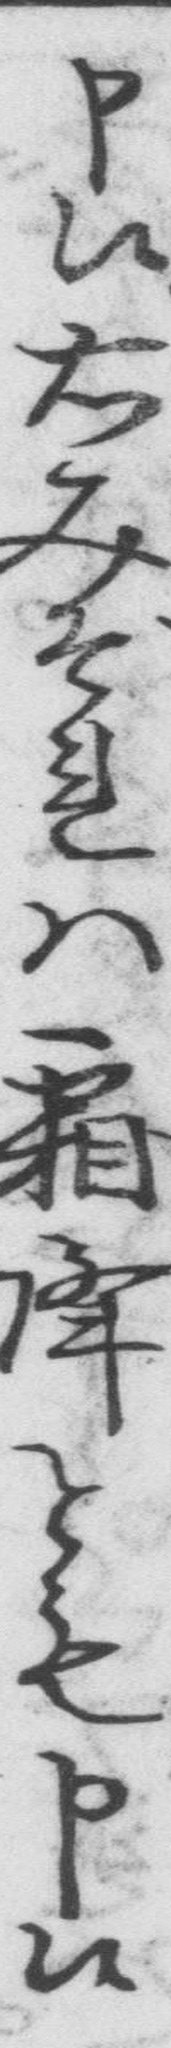申候。右みぞれは。霜降とも申候
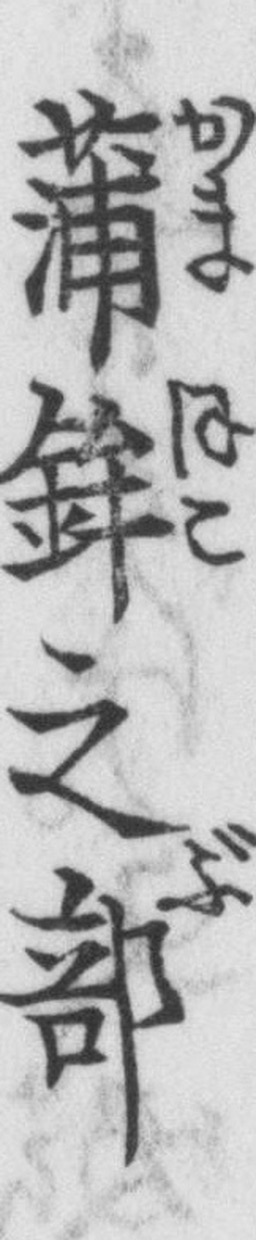蒲鉾之部
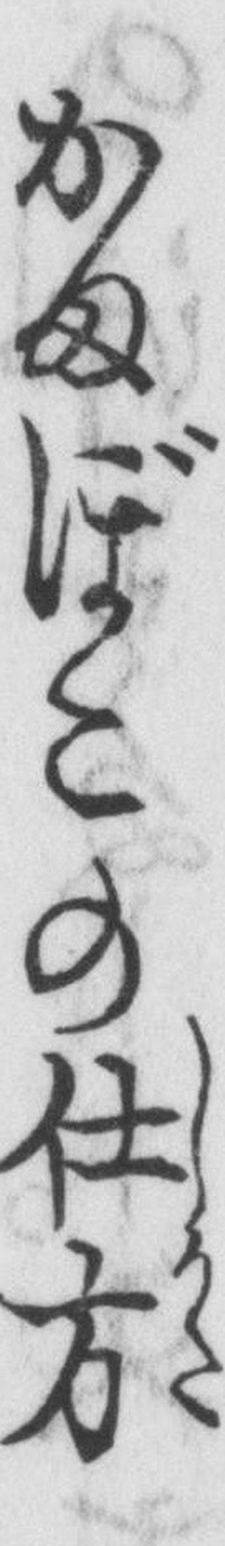かまぼこの仕方
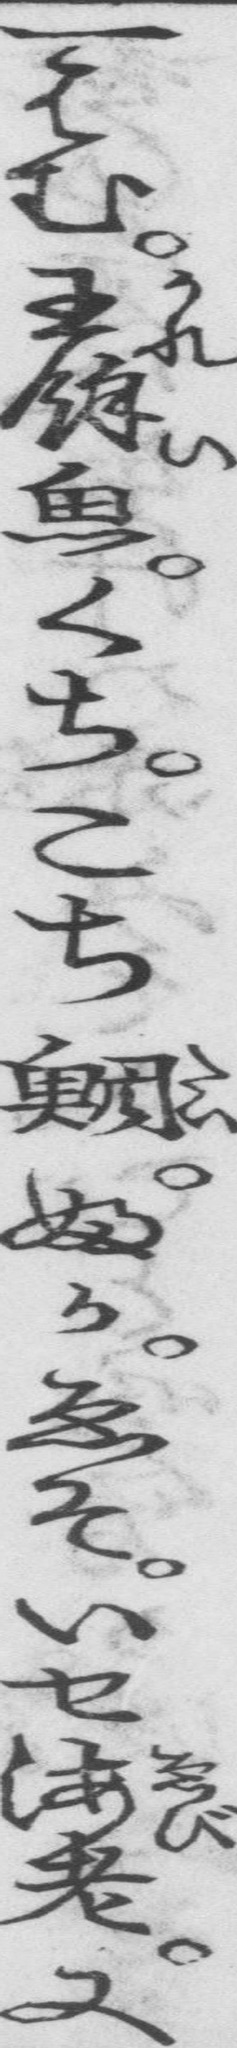一はむ。王余魚。くち。こち。鯛。ふか。ゑそ。いせ海老。又
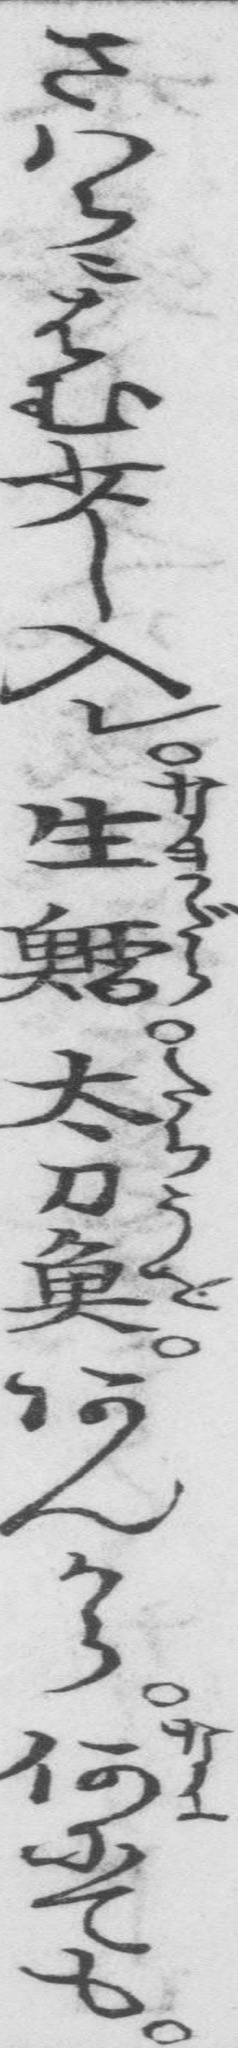さはらにはむ少し入れ。生鱈。太刀魚。あんかう。何にても。
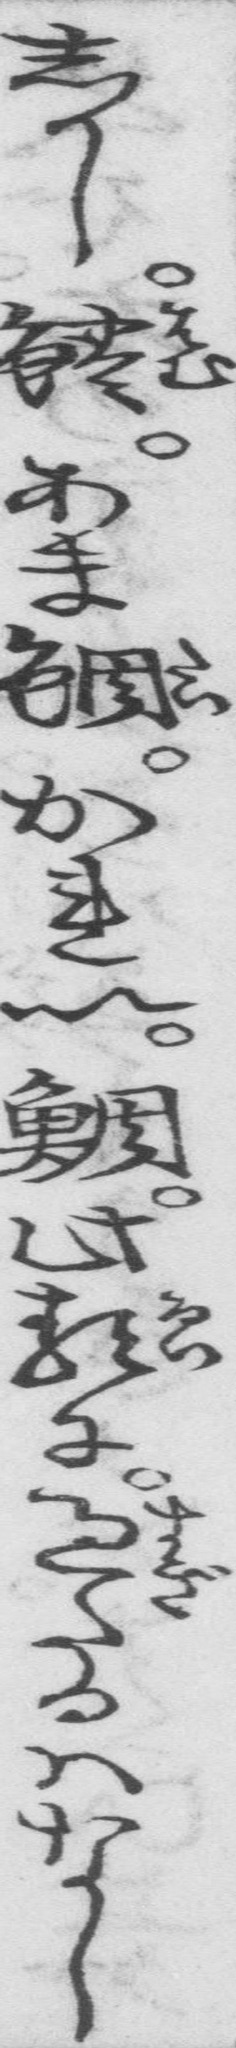しかし。鱧。あま鯛。かれい。鯛。此類に。過たるはなし
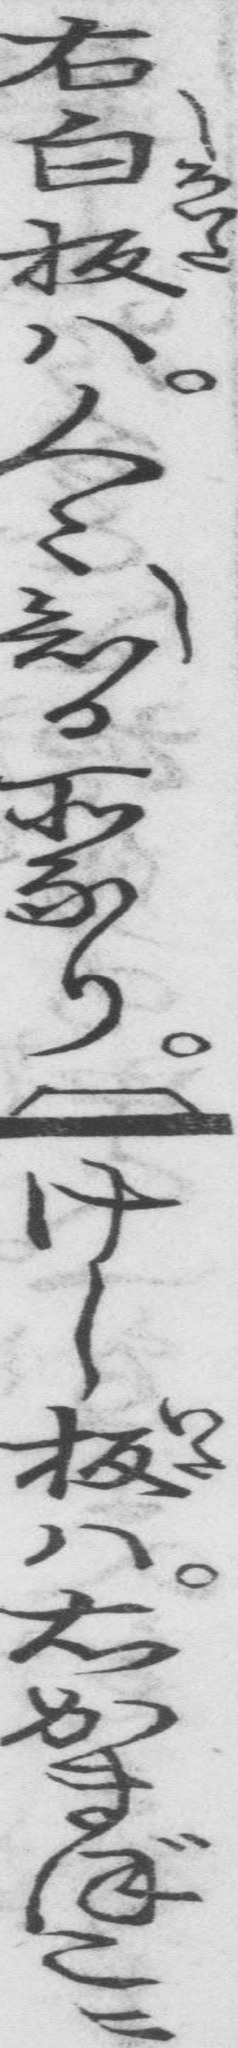右白板は、。人々知る所なり。けし板は。右かまぼこに
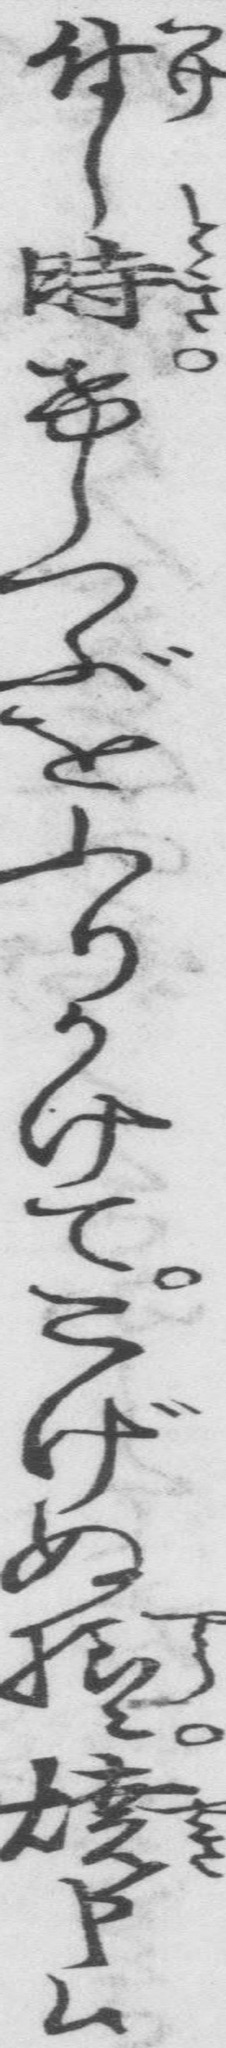付し時。けしつぶをふりかけて。こげぬ様に。焼申候
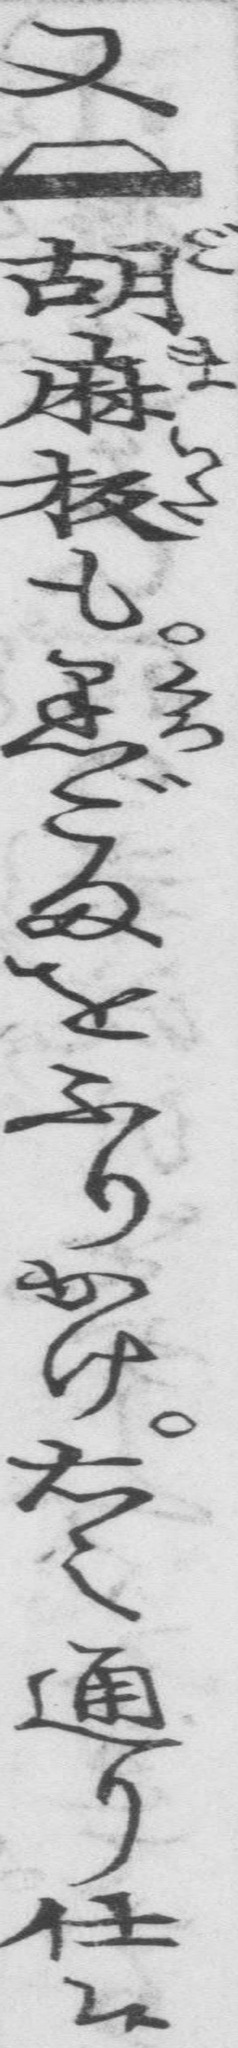又胡麻板も。黒ごまをふりかけ。右之通り仕候
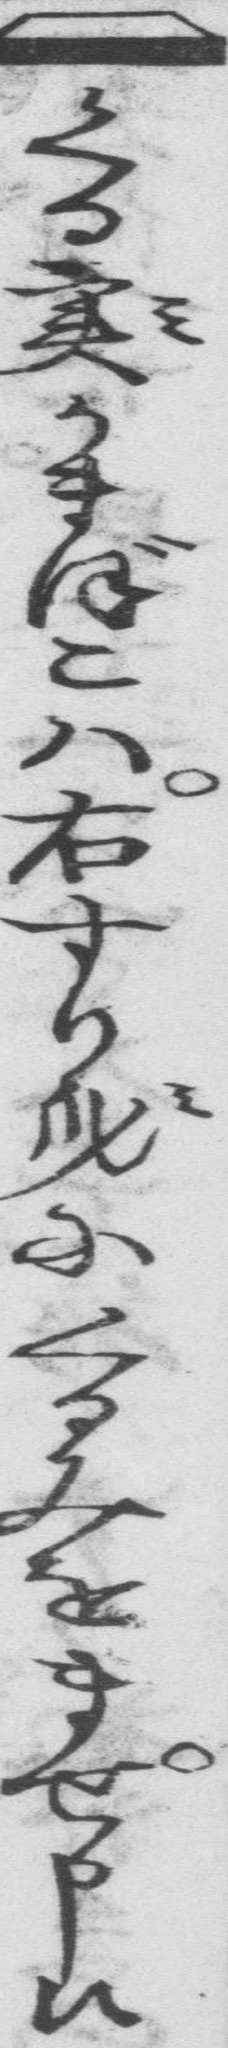くる実かまぼこは。右すり身にくるみをまぜ申候
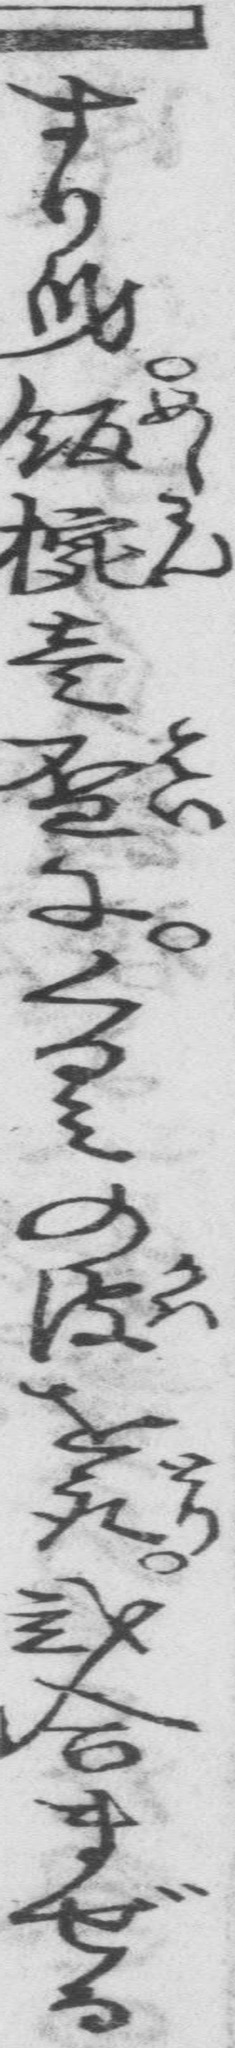すり身。飯椀壱盃に。くるみの皮を取。弐合まぜる
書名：萬寳料理秘密箱
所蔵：大阪府立大学学術情報センター 国文学研究資料館
